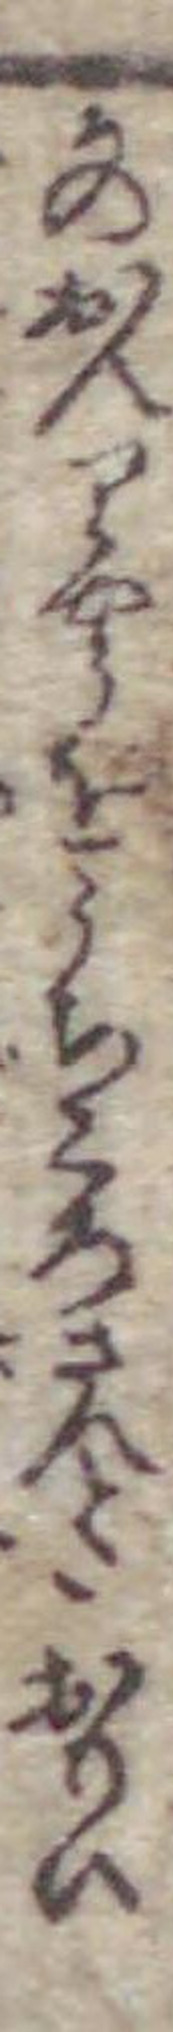かのおんりやうをうちころさんとおもい
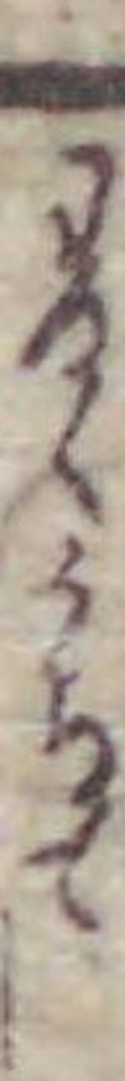わるくうちて
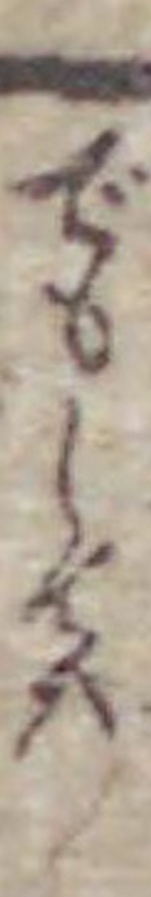でもしては
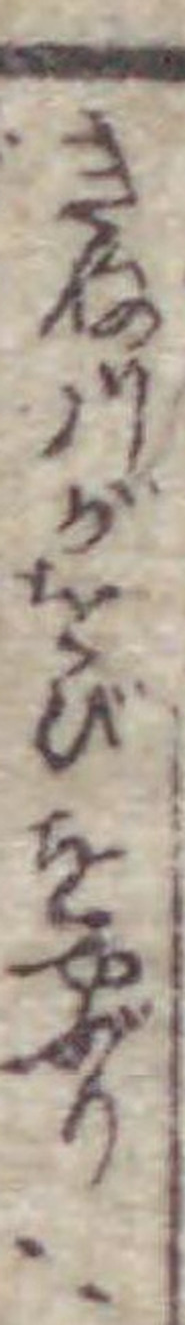きぬ川がをびをやぶり
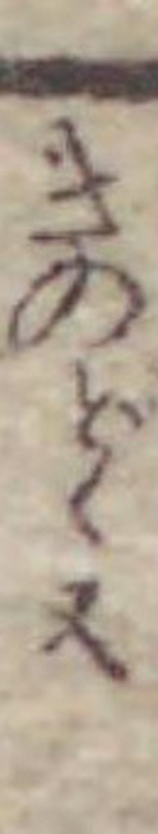きのどく又
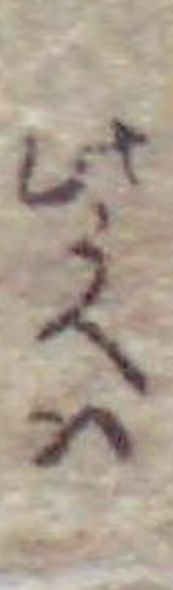此うへは
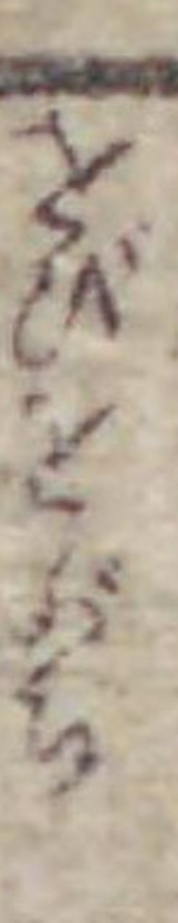をびをぶち
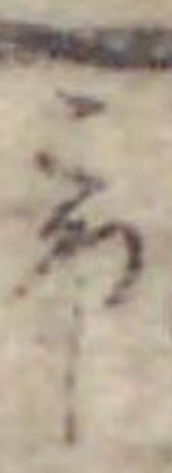ころし
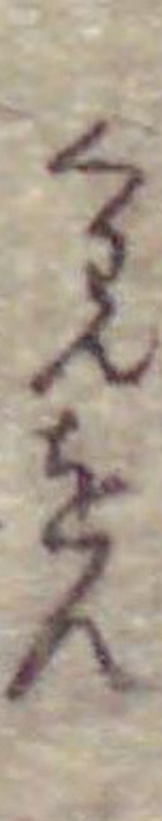くわんをん
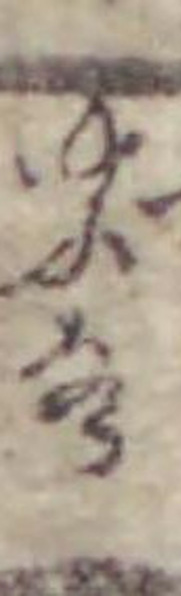ゆふなら
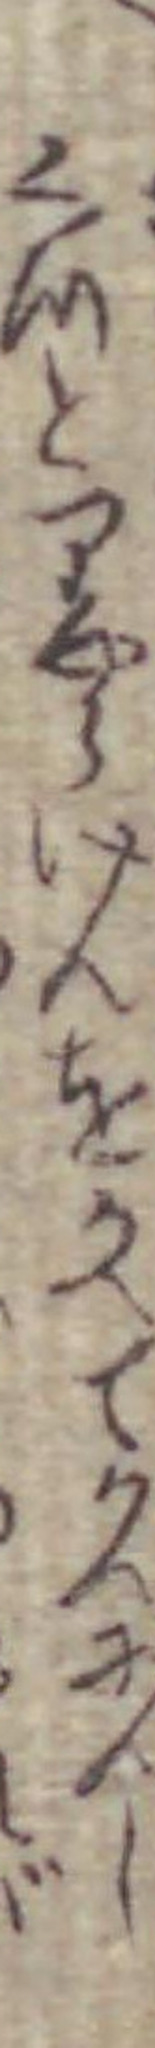くつとりようけんをかへてかんにんし
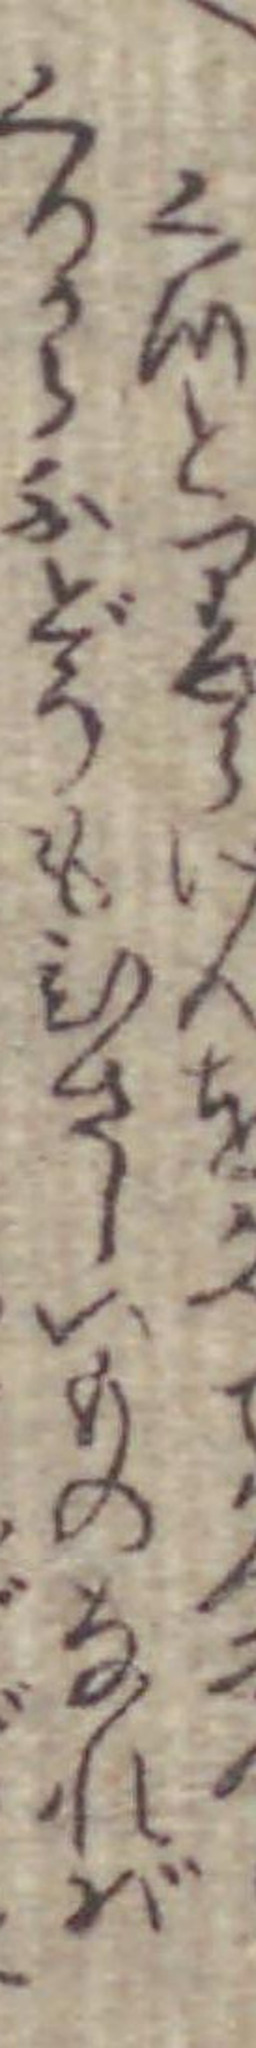くりからふどうもひさしいものなれば
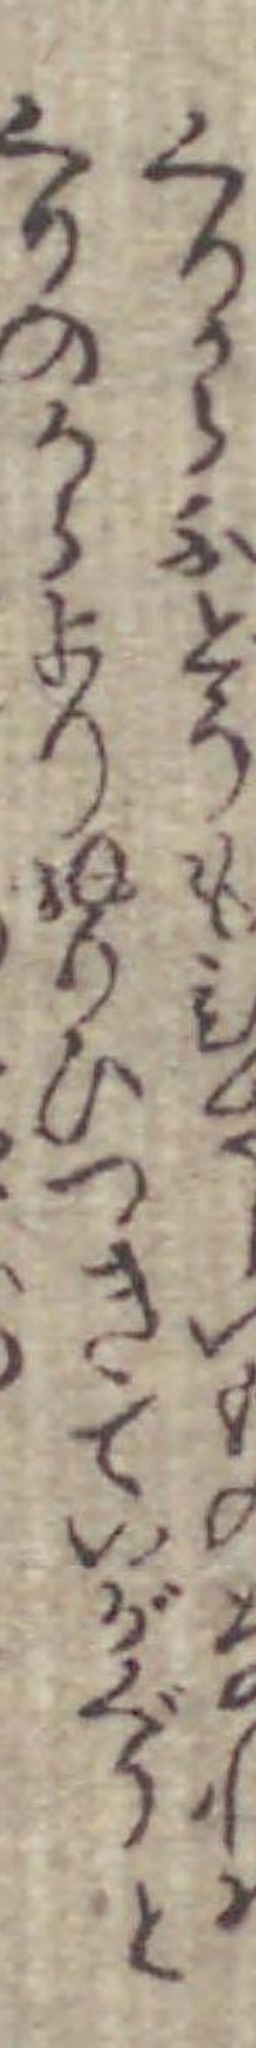くりのからよりおもひつきていがぐりと
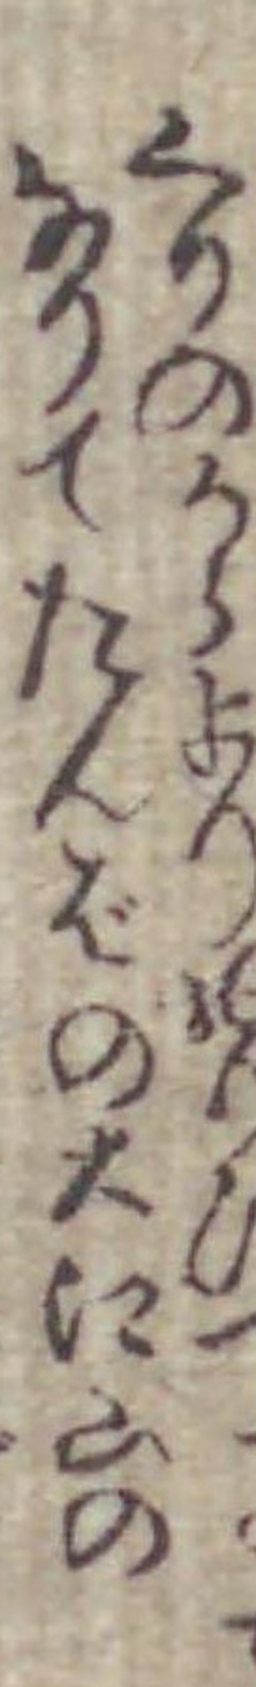なりてたんばの大江山の
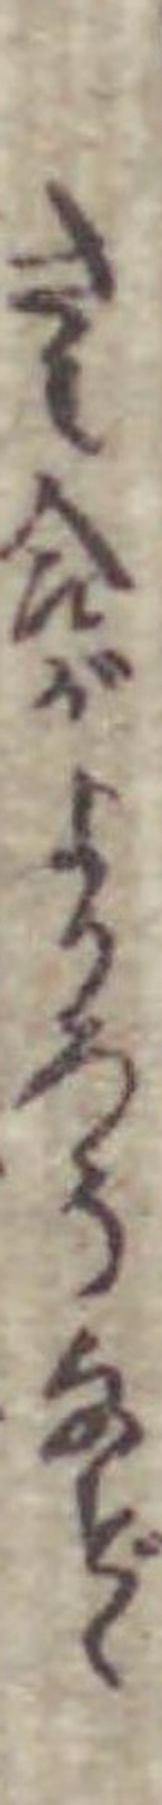さし合がよかろうなどゝ
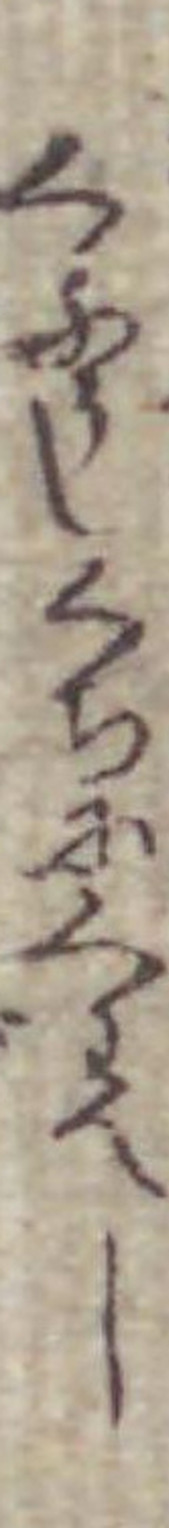くふうしくちにくわへし
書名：嗚呼不侭世之助噺 : 3巻
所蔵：国立国会図書館 National Diet Library, JAPAN
